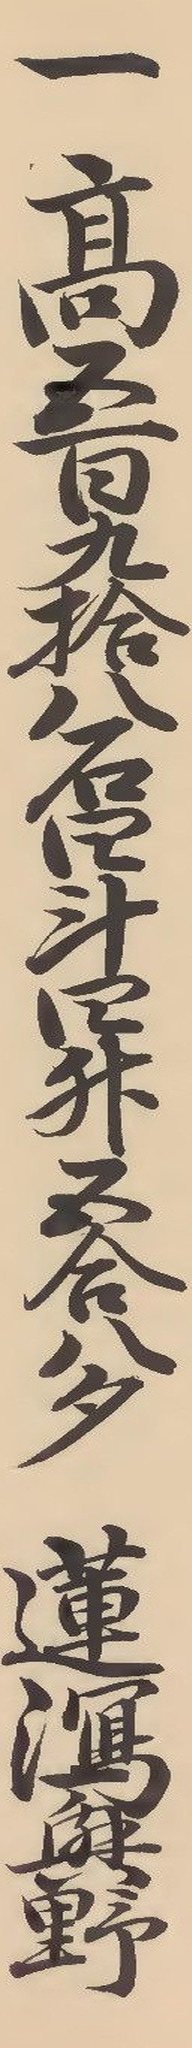一高五百九拾八石四斗四升五合八勺蓮潟興野
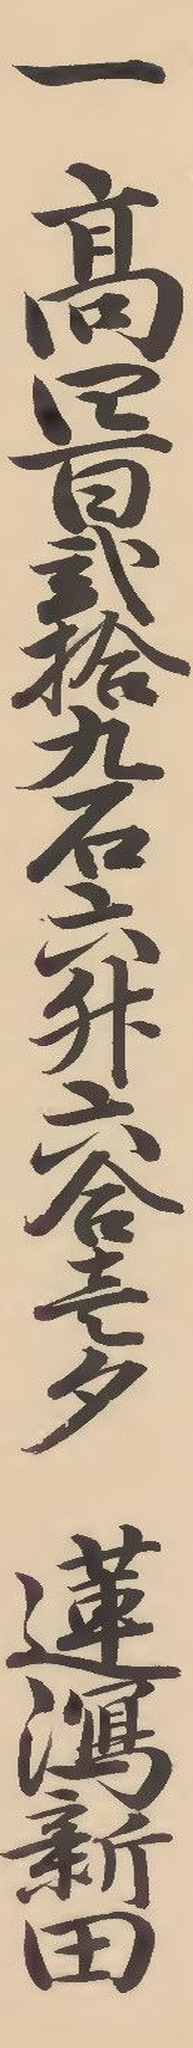一高四百弐拾九石六升六合壱勺蓮潟新田

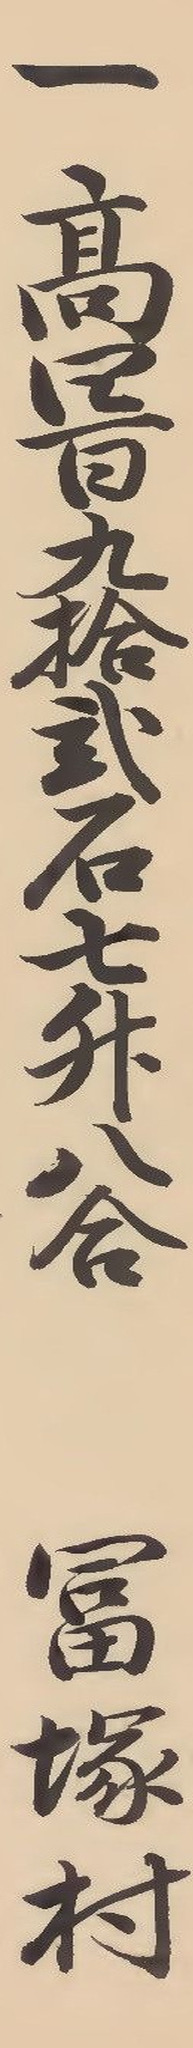一高四百九拾弐石七升八合富塚村
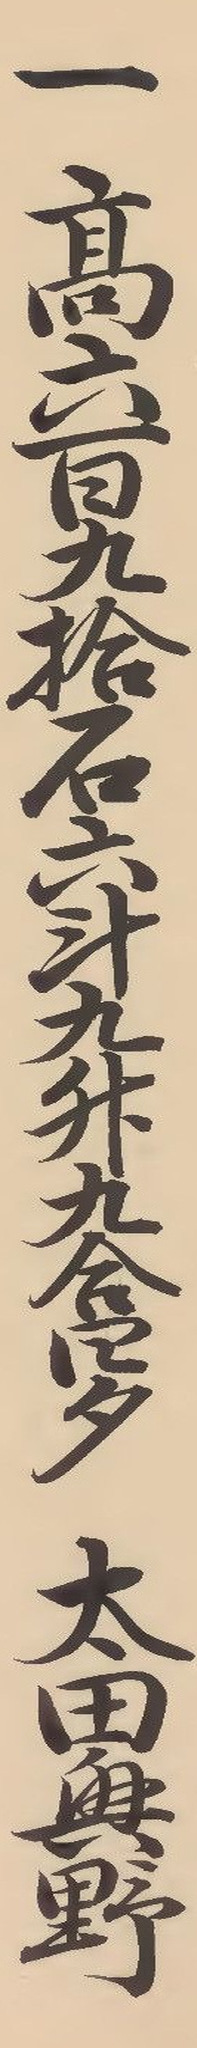一高六百九拾石六斗九升九合四勺太田興野
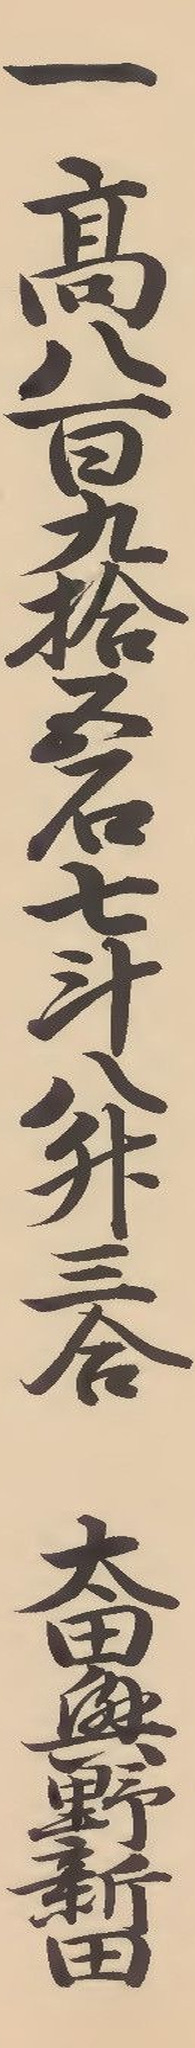一高八百九拾五石七斗八升三合太田興野新田
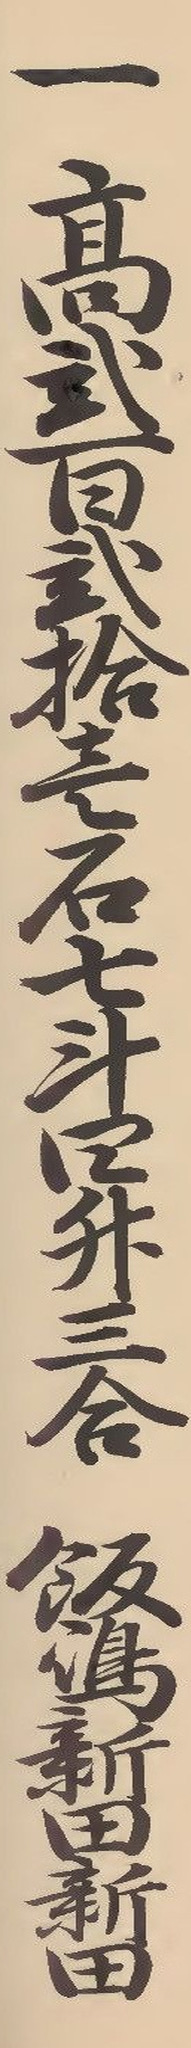一高弐百弐拾壱石七斗四升三合飯島新田新田
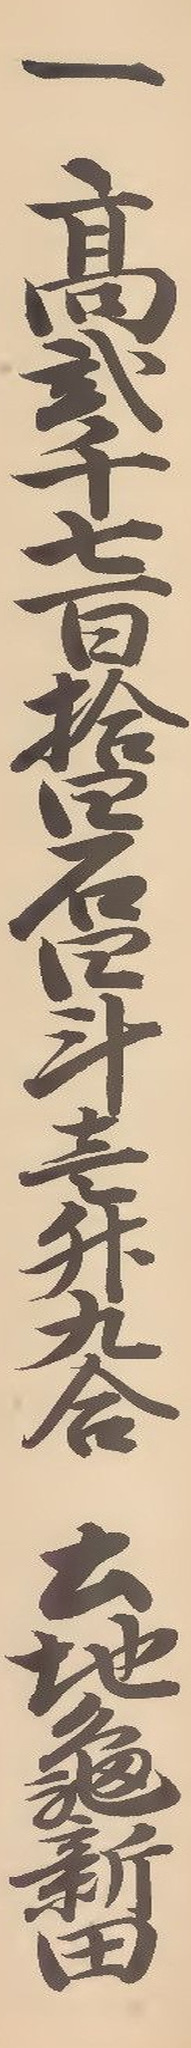一高弐千七百拾四石四斗壱升九合土地亀新田
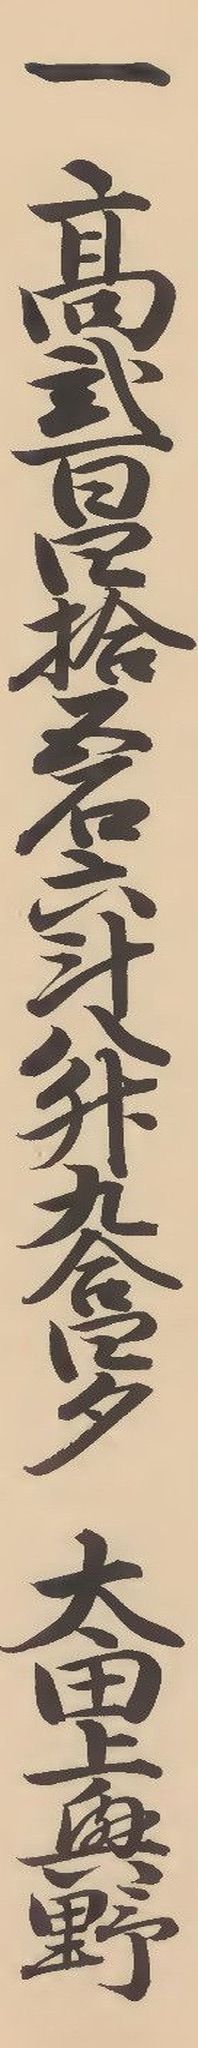一高弐百四拾五石六斗八升九合四勺太田上興野
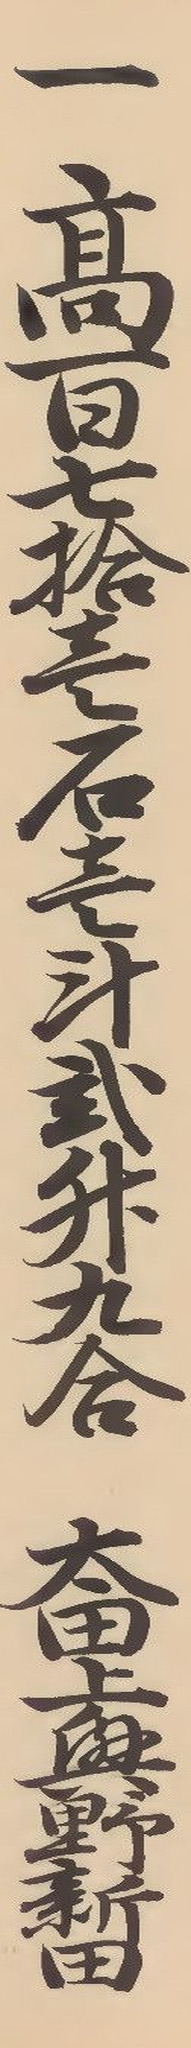一高百七拾壱石壱斗弐升九合太田上興野新田
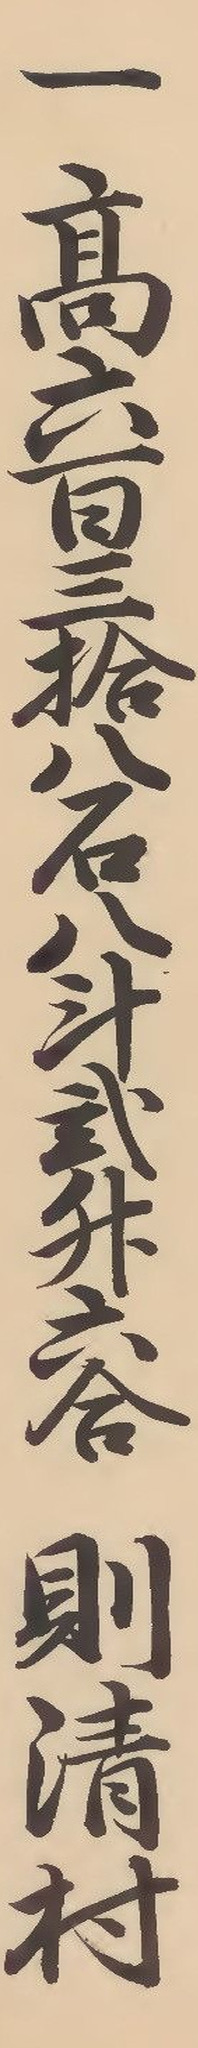一高六百三拾八石八斗弐升六合則清村

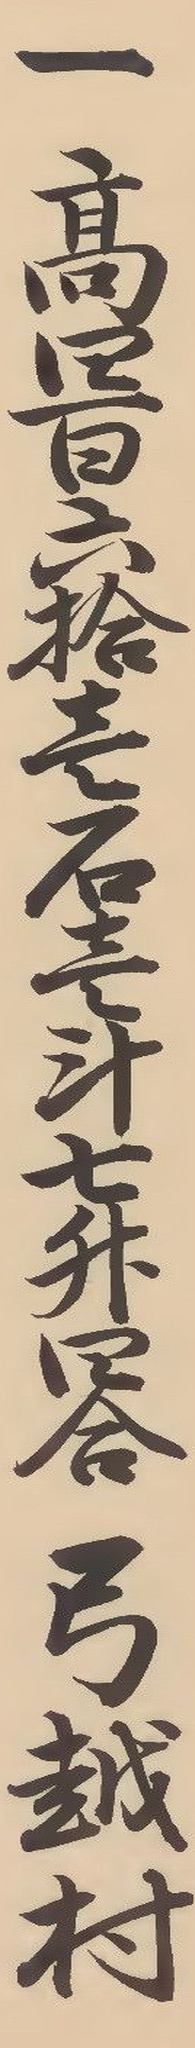一高四百六拾壱石壱斗七升四合弓越村
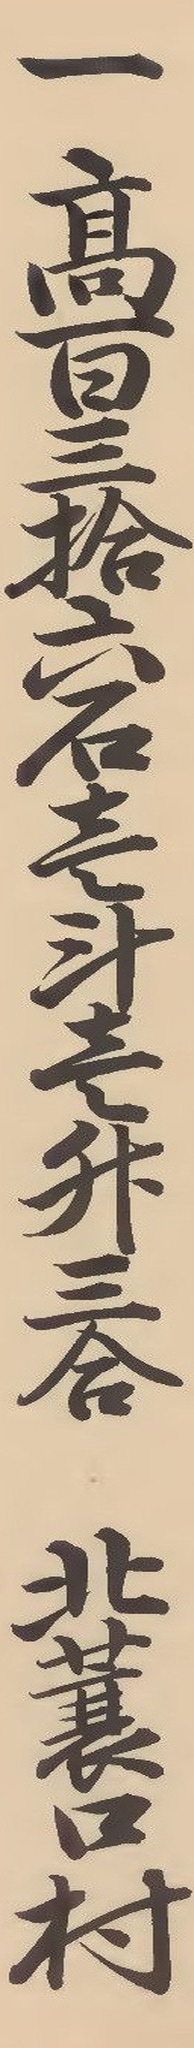一高百三拾六石壱斗壱升三合北蓑口村
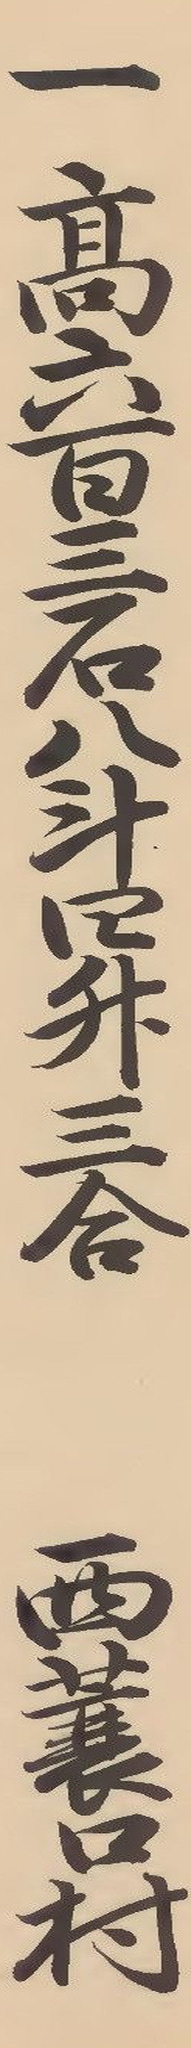一高六百三石八斗四升三合西蓑口村
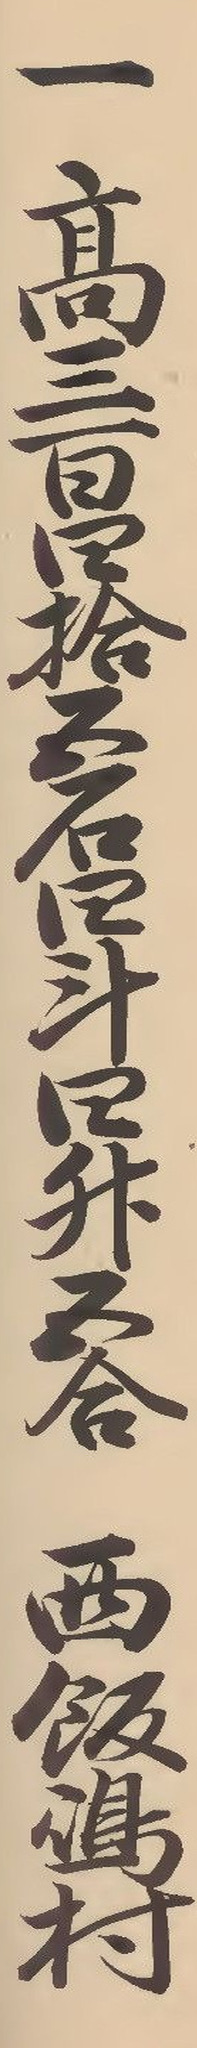一高三百四拾五石四斗四升五合西飯島村
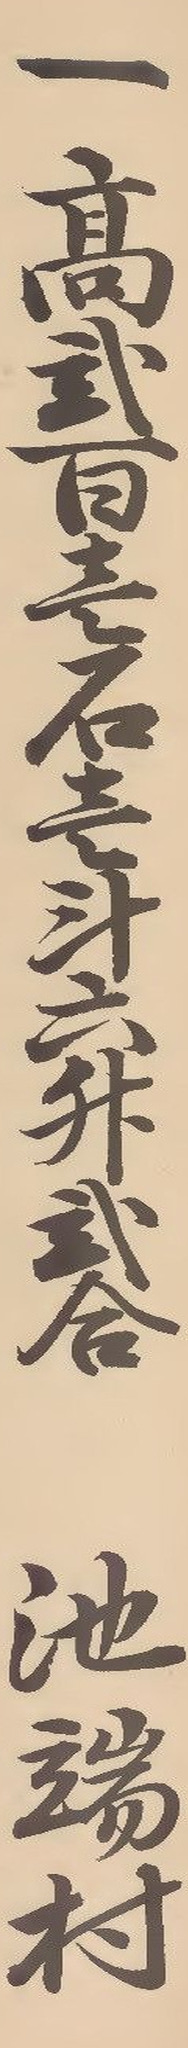一高弐百壱石壱斗六升弐合池端村
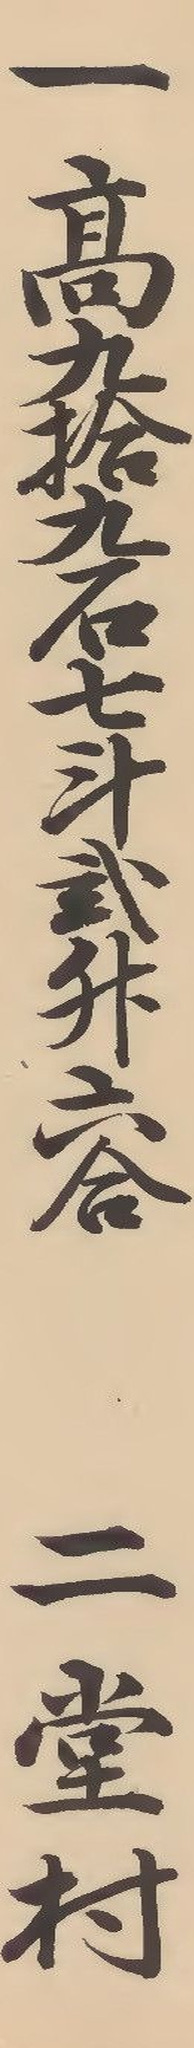一高九拾九石七斗弐升六合二堂村
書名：越後国郷帳　下
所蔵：国立公文書館 National Archives of Japan
